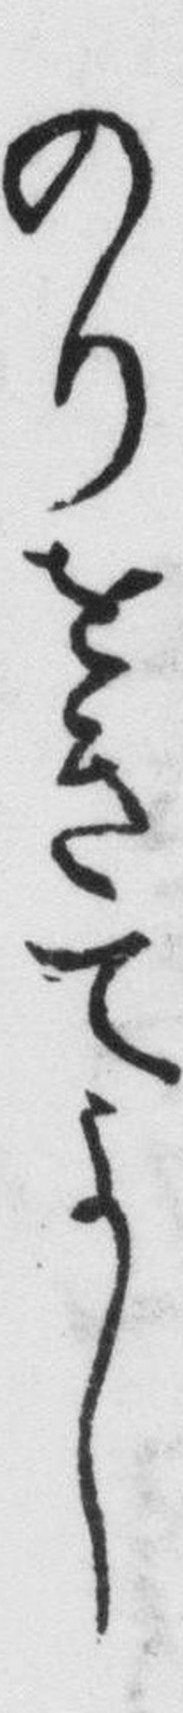のりをきてよし
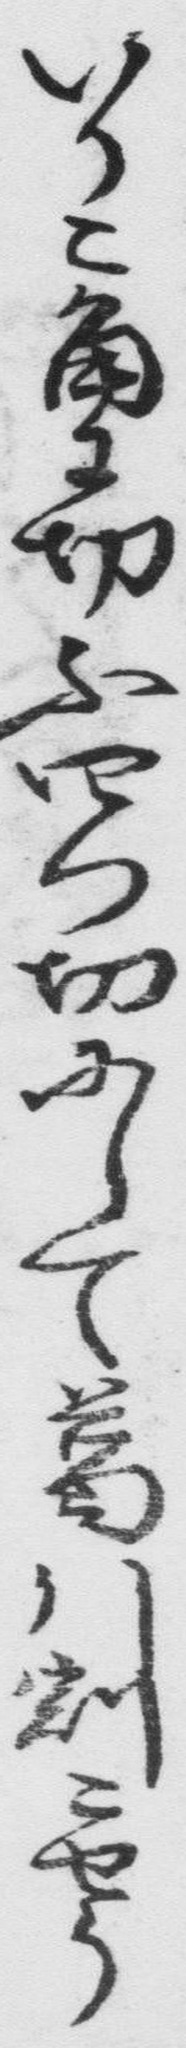いりこ角尓切ふ四つ切尓して葛引割こせう
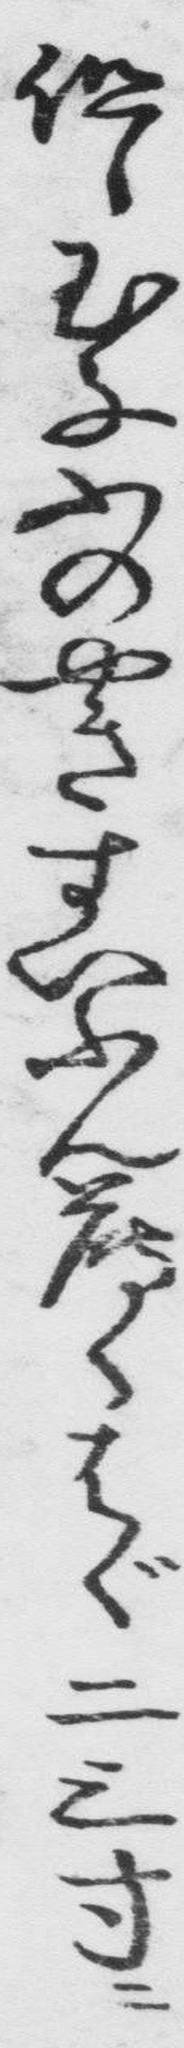牛肉但し玉子ふのやきすいふん薄くはぐ二三寸に

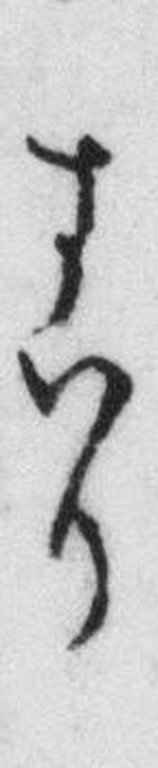すいり
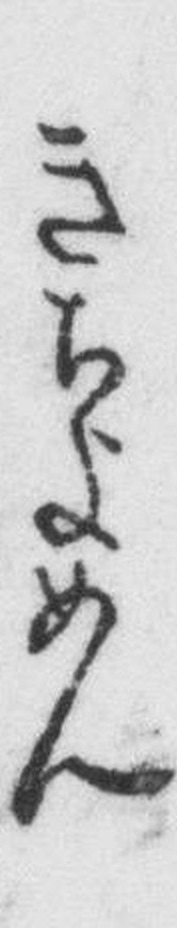きちよめん
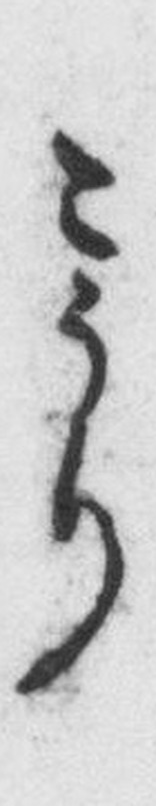こうり
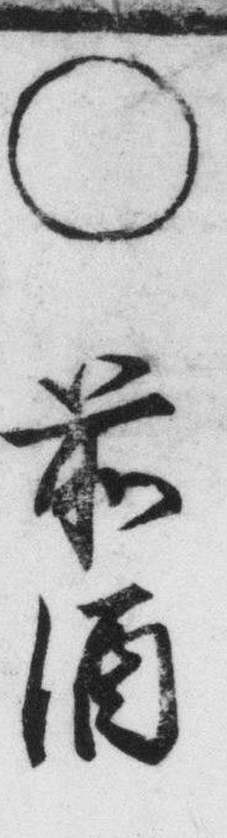〇前酒
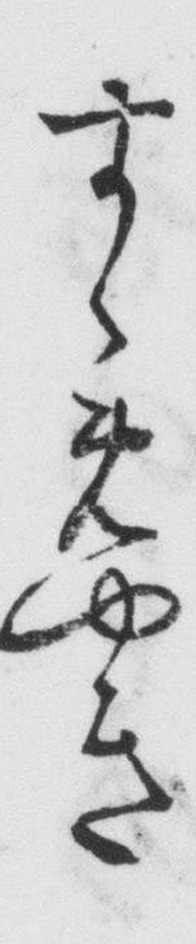すゝ免やき
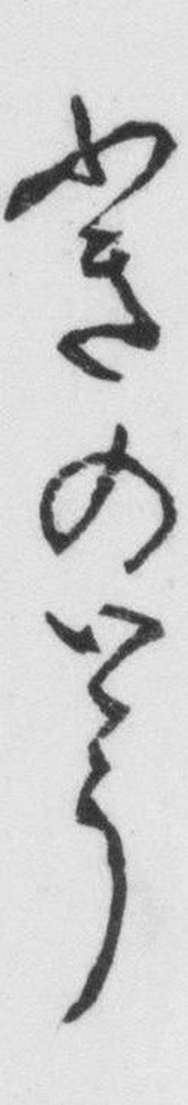ふきのとう

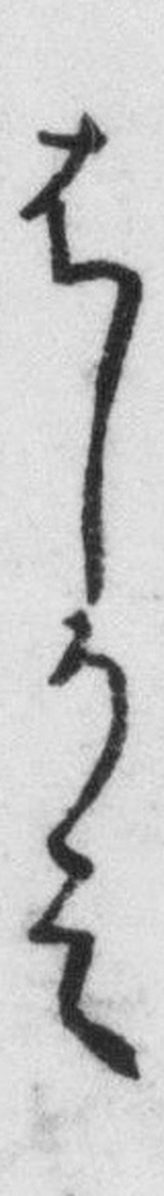はしかみ
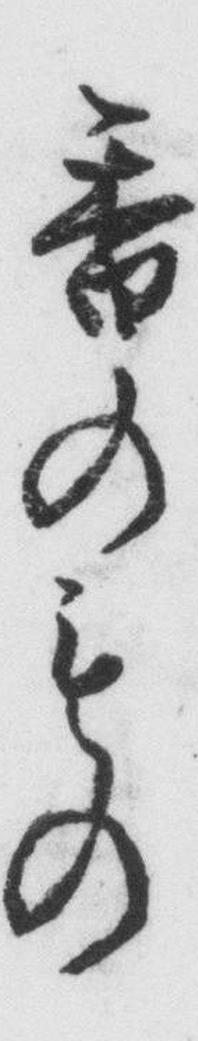香のもの
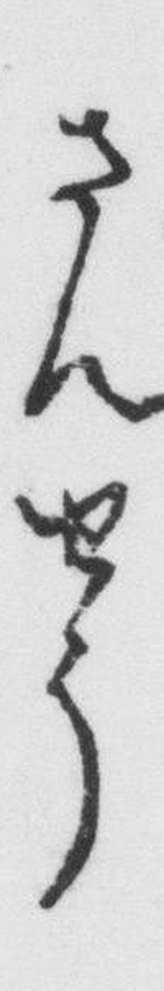さんせう
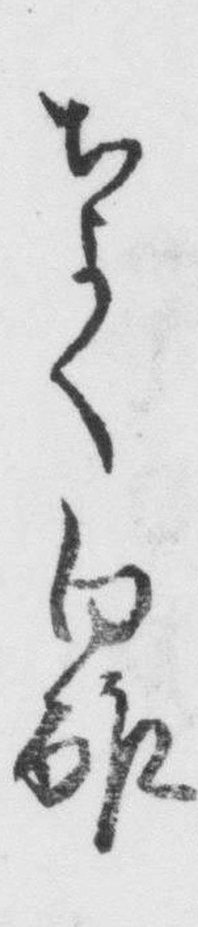ちよく白酢
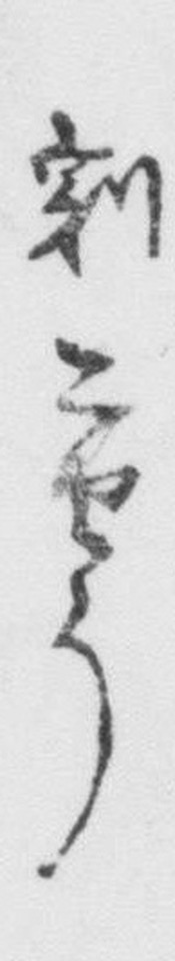割こせう

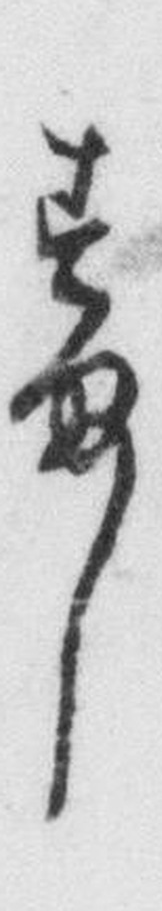春まし
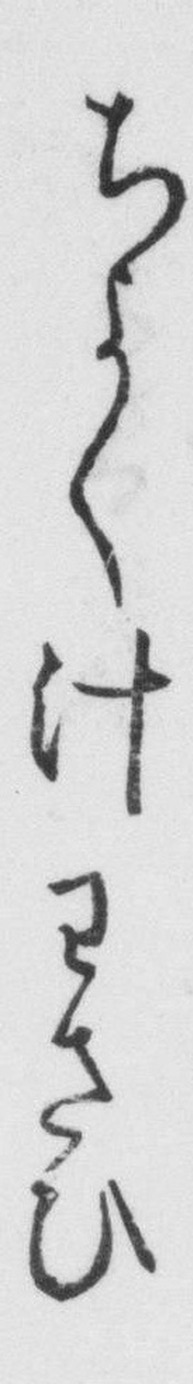ちよく汁わさひ
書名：普茶料理抄
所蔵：大阪府立大学学術情報センター 国文学研究資料館
